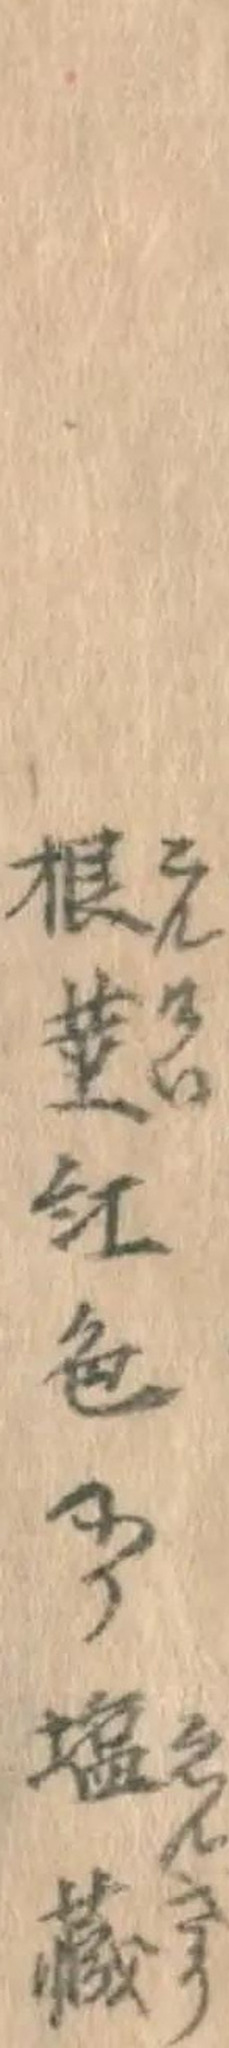根茎紅色なり塩蔵
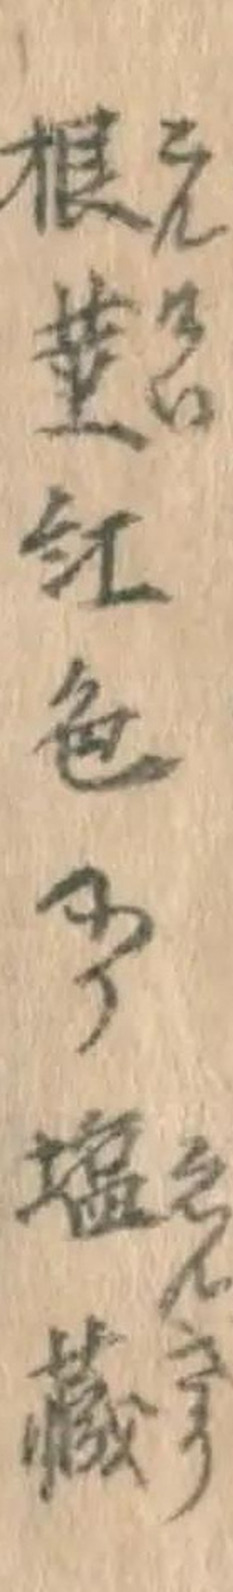根茎紅色なり塩蔵
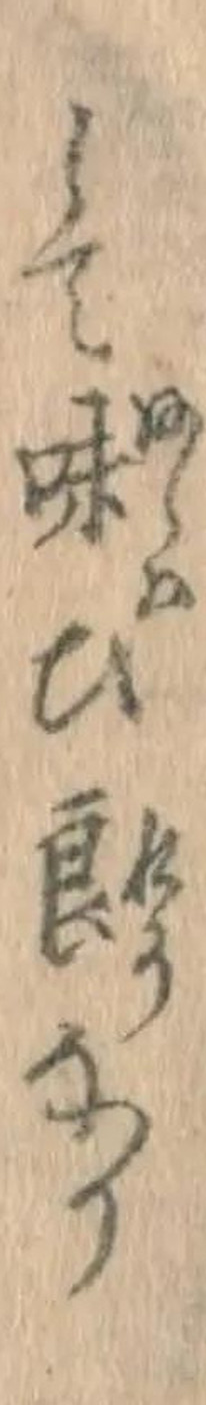して味ひ良なり

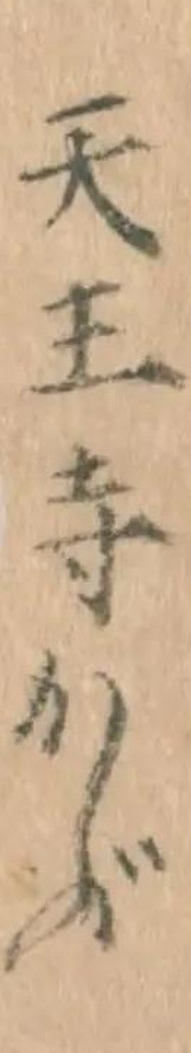天王寺かぶ
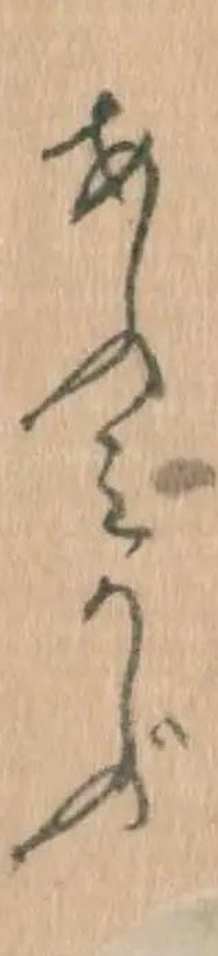あふみかぶ
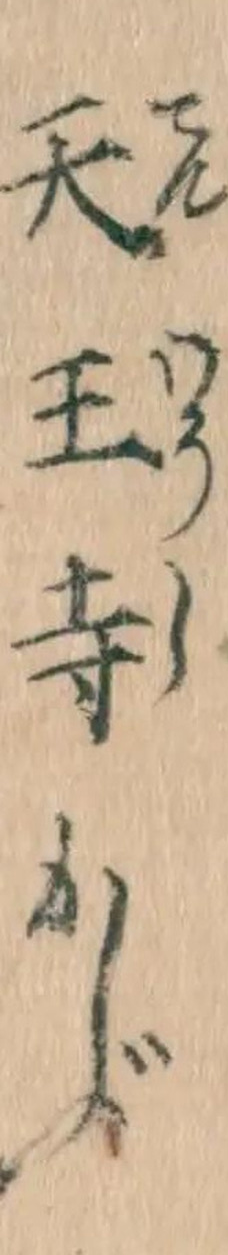天王寺かぶ
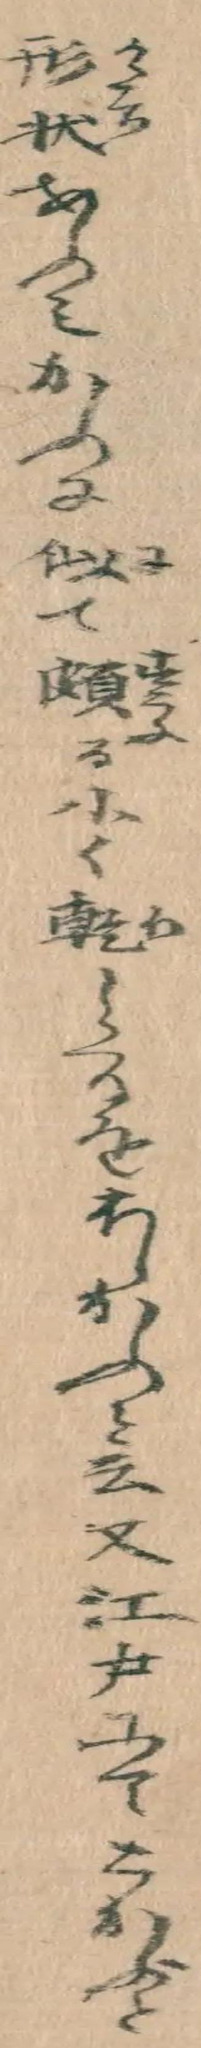形状あふみかふに似て頗る小く乾したるをほしかふと云又江戸にてこかぶと
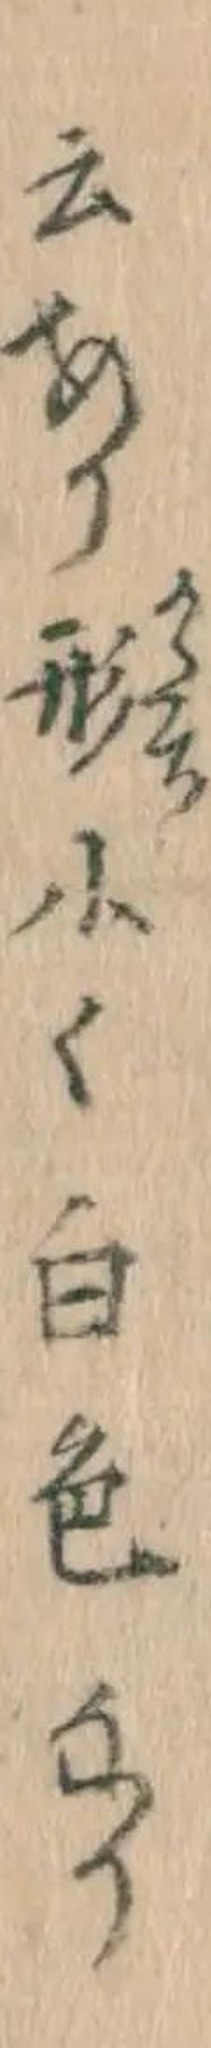云あり形小く白色なり
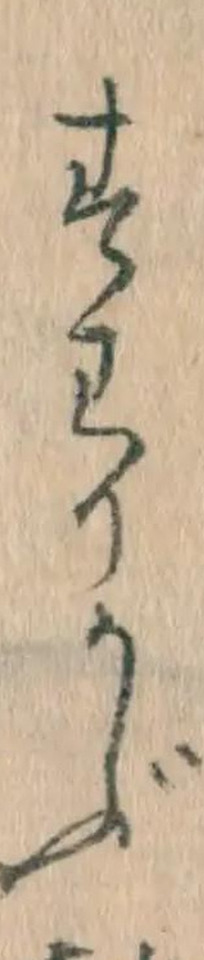すわりかぶ
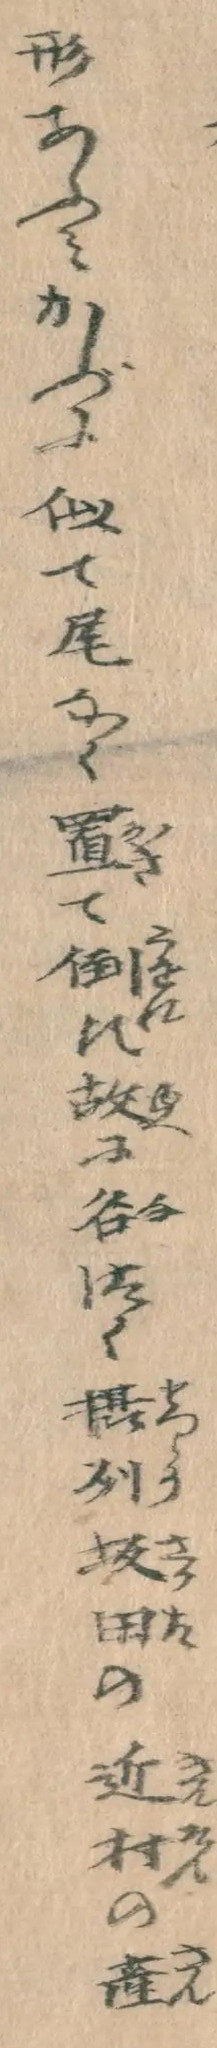形あふみかぶに似て尾なく置て倒す故に名つく摂州坂田の近村の産
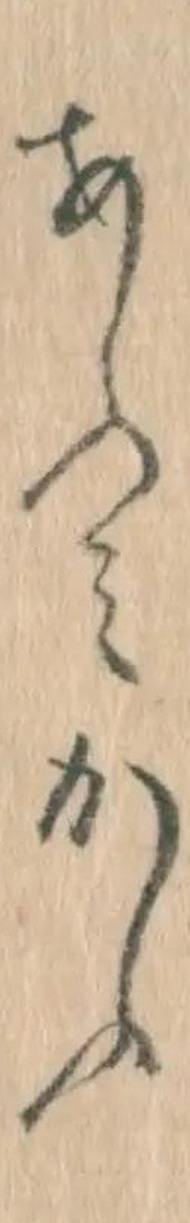あふみかぶ
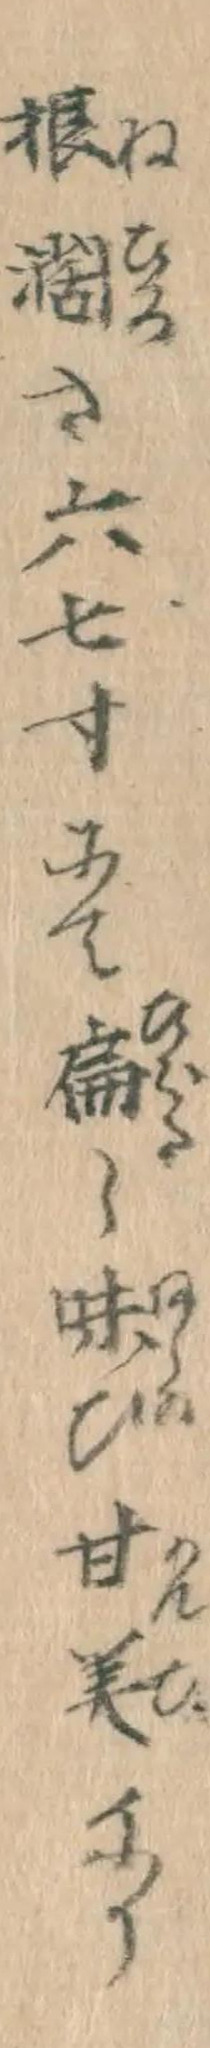根闊さ六七寸にて扁し味ひ甘美なり

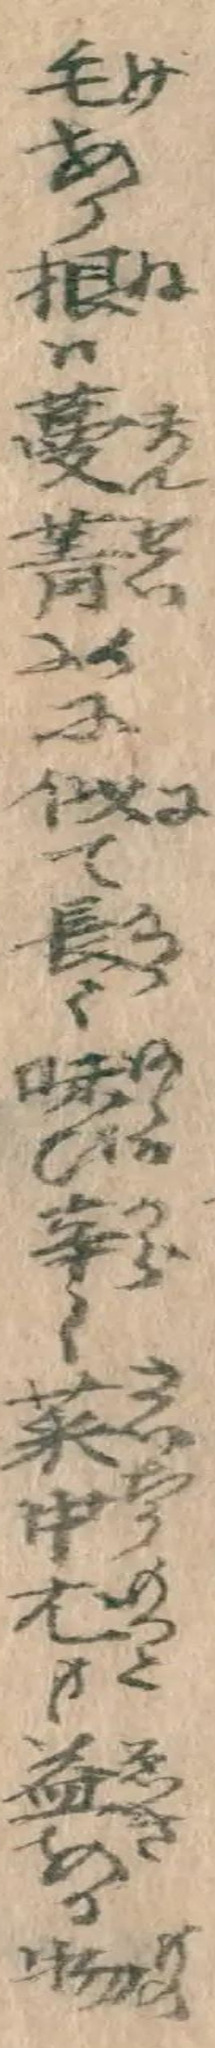毛あり根は蔓菁かふに似て長く味ひ辛し菜中尤も益ある物
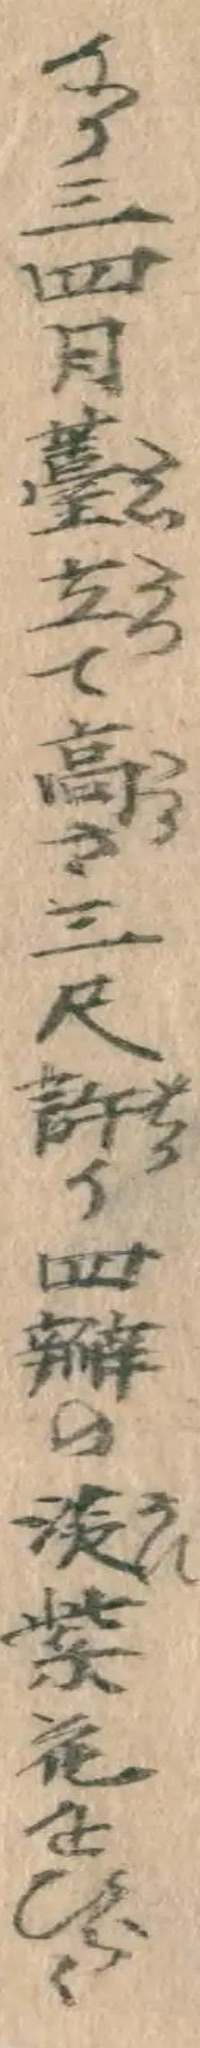なり三四月薹立て高さ三尺許り四弁の淡紫花をひらく
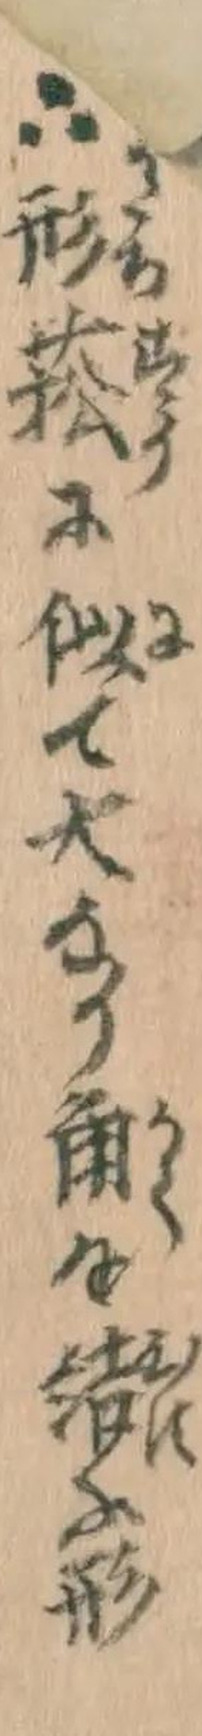∴形菘に似て大なり角を結ふ形
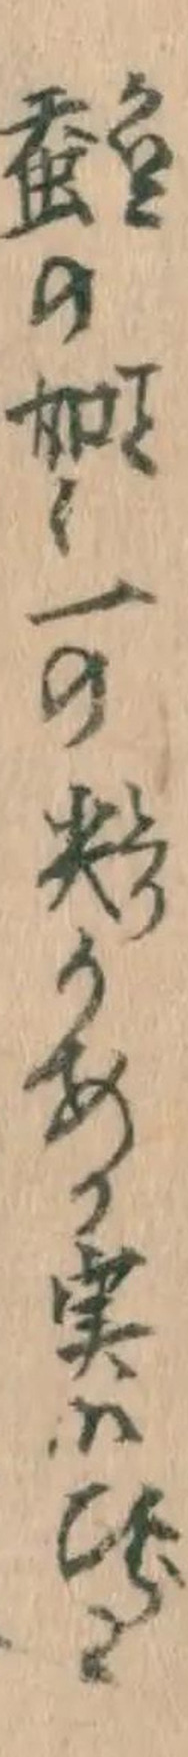蚕の如く一の尖りあり実はひらた
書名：本草図譜. 巻46-48
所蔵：国立国会図書館 National Diet Library, JAPAN
